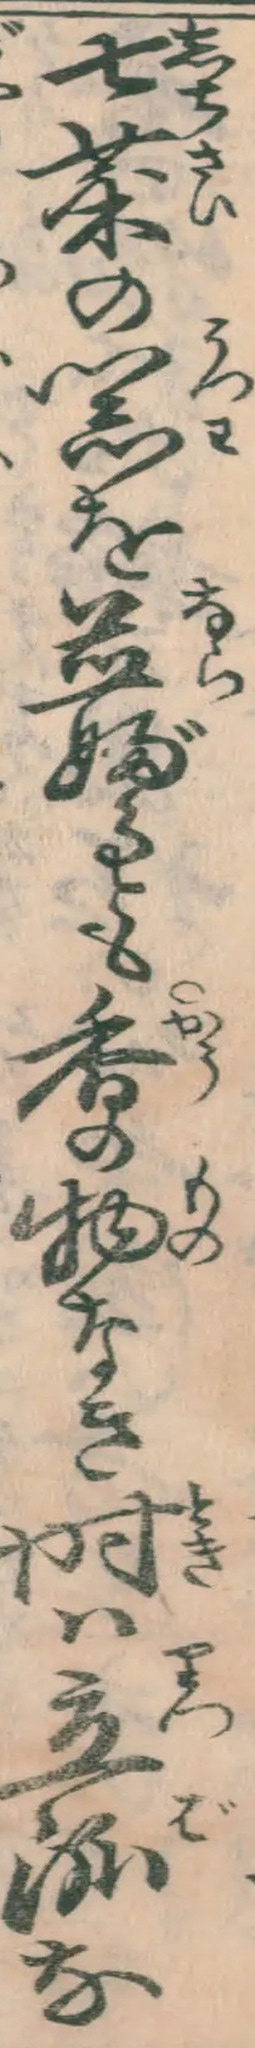七菜の器を並ぶるとも。香の物なき時は立派な
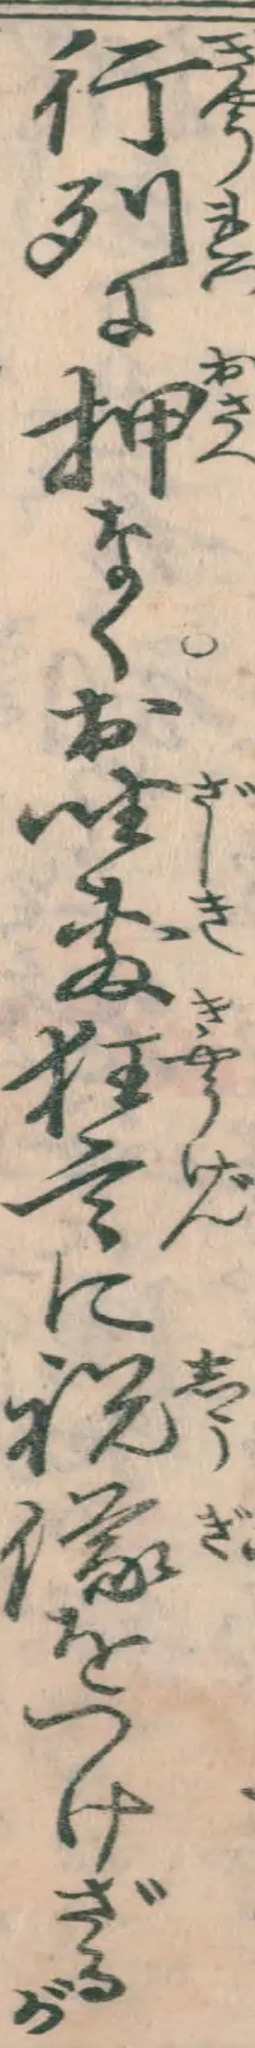行列に押なく。お座敷狂言に祝儀をつけざるが
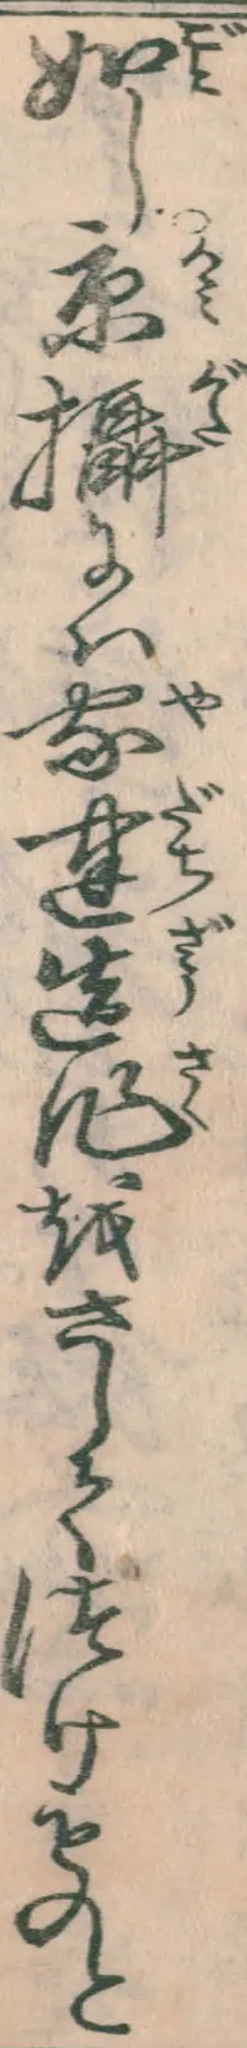如し。京摂には家建造作をさしてつけものと
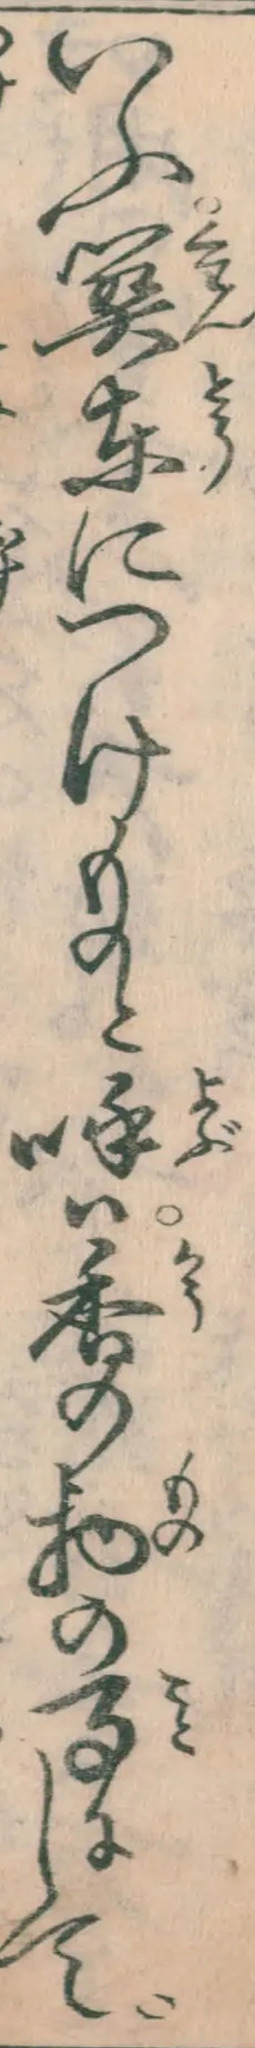いふ。関東につけものと呼は。香の物の事にして。
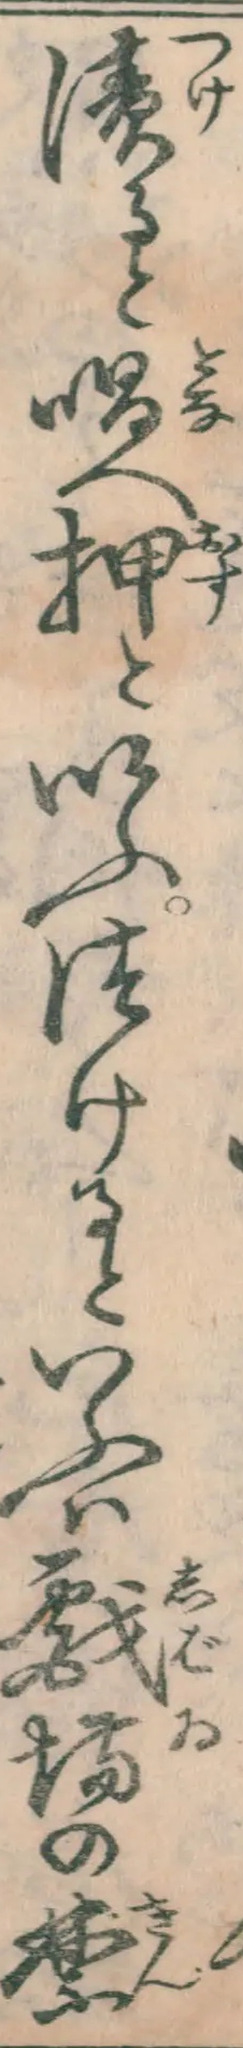漬ると唱へ押といふ。つけるといふは戯場の禁
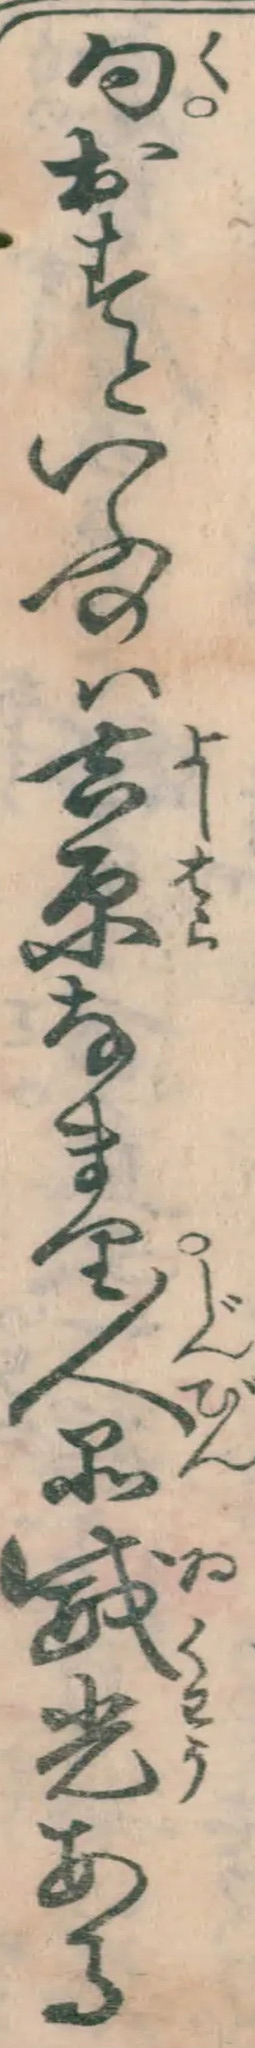句。おすといふのは吉原なまり。人品威光ある

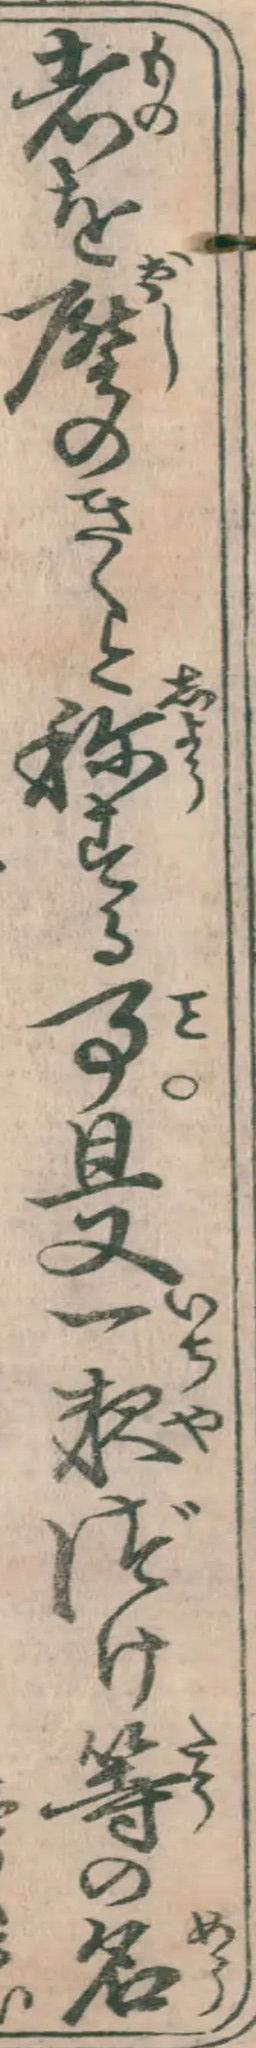者を圧のきくと称する事。且又一夜づけ等の名
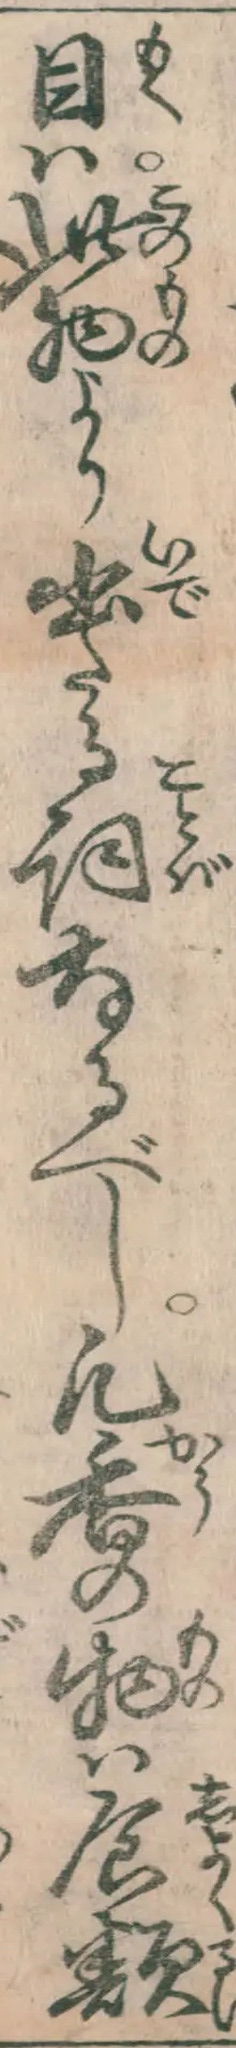目は。此物より出たる詞なるべし。凡香の物は食類
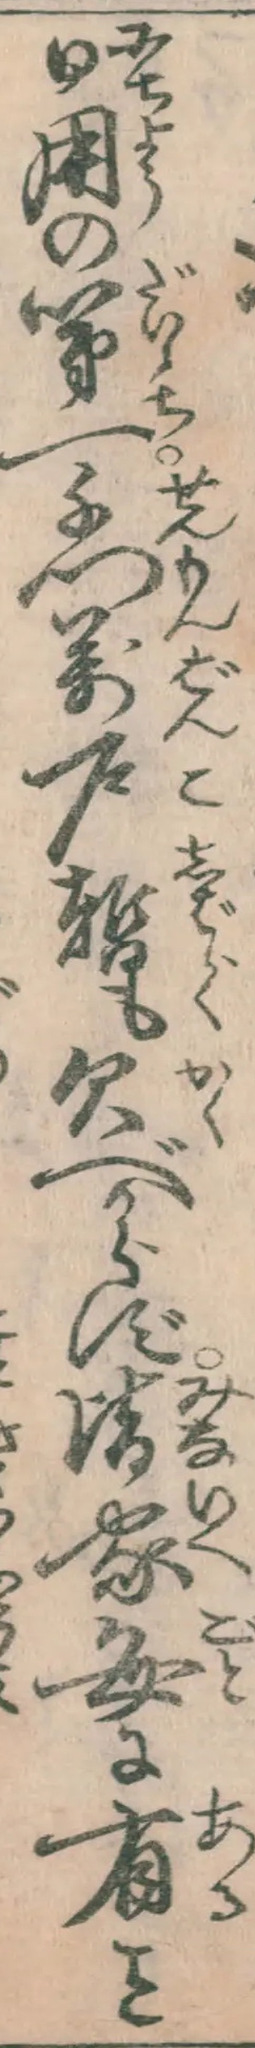日用の第一。千門万戸暫も欠べからず。皆家毎に有こと
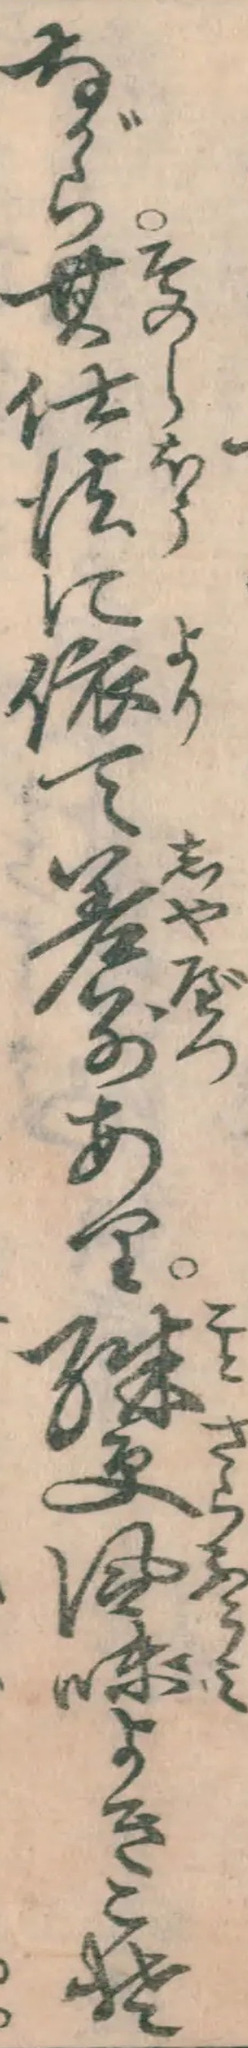ながら。其仕法に依て差別あり。殊更風味よきこそ
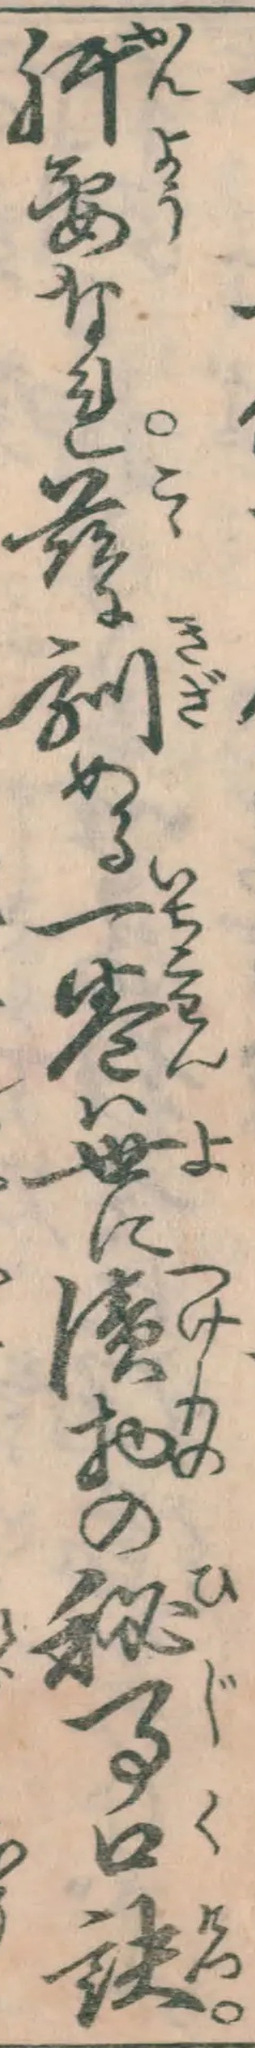肝要なれ。茲に刻める一巻は世に漬物の秘事口訣。
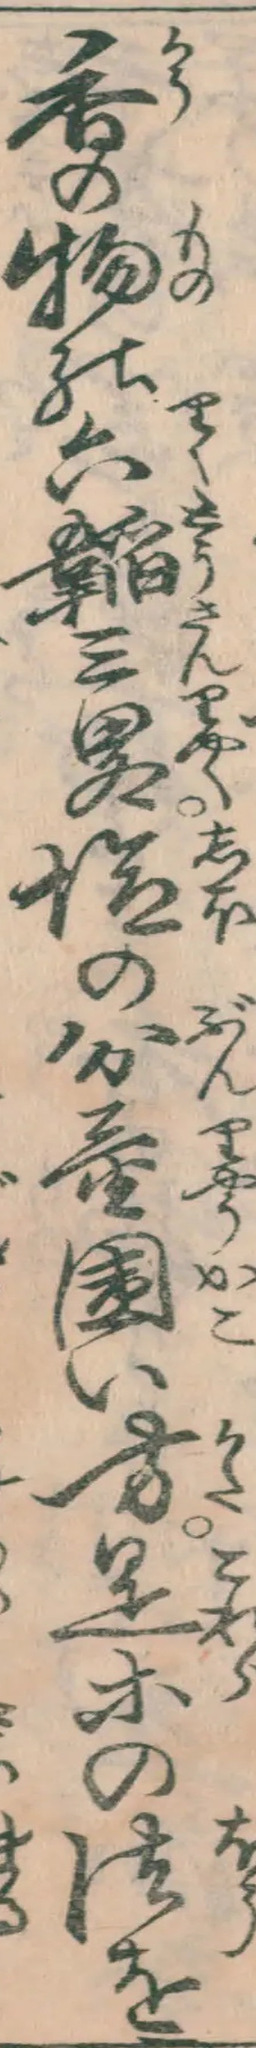香の物の六韜三略。塩の分量囲い方。是等の法を
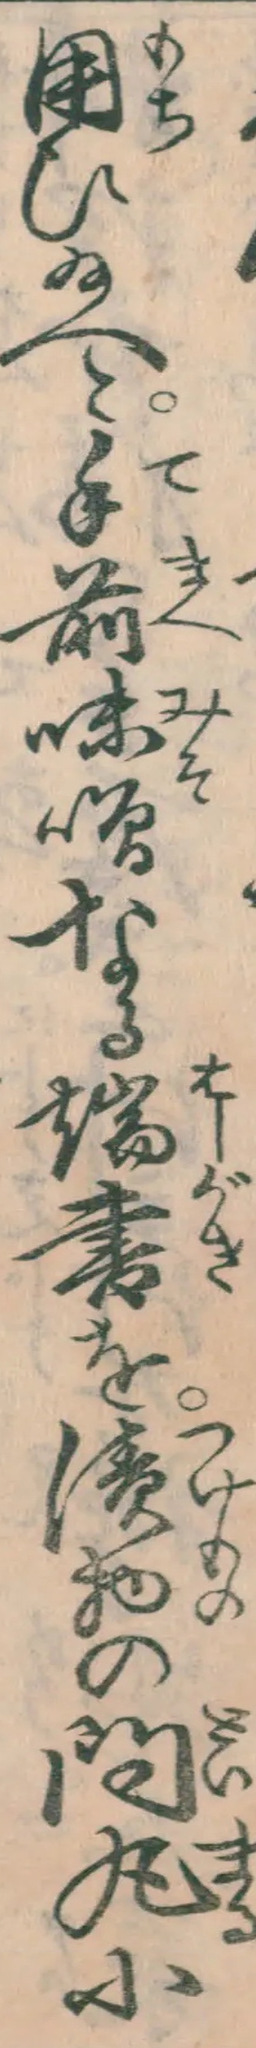用ひ給へと。手前味噌なる端書を。漬物の問丸に
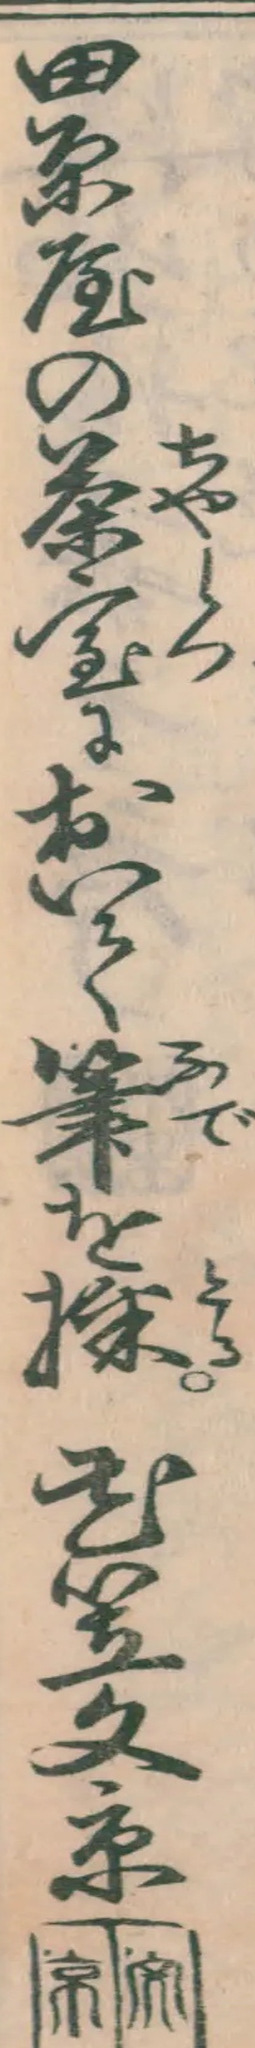田原屋の茶室において筆を採。花笠文京
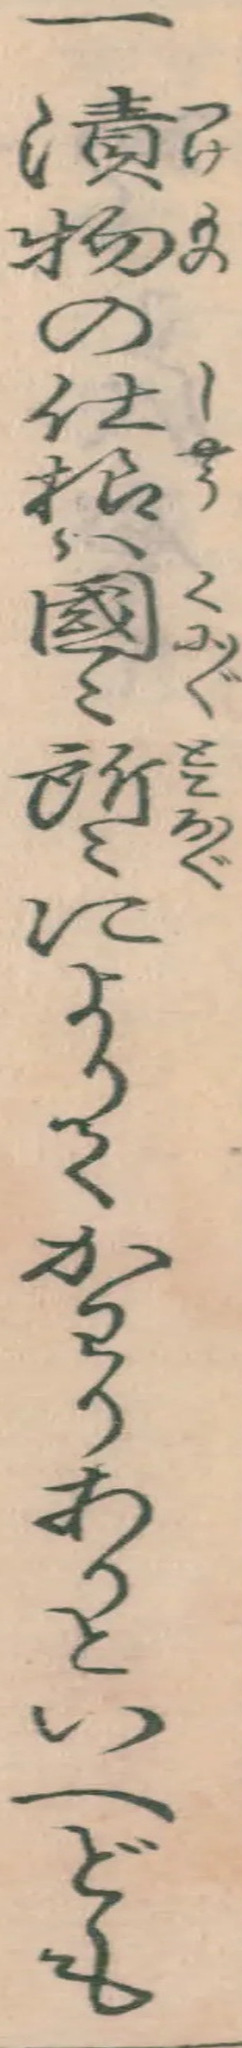一漬物の仕様は国々所々によりてかわりありといへども
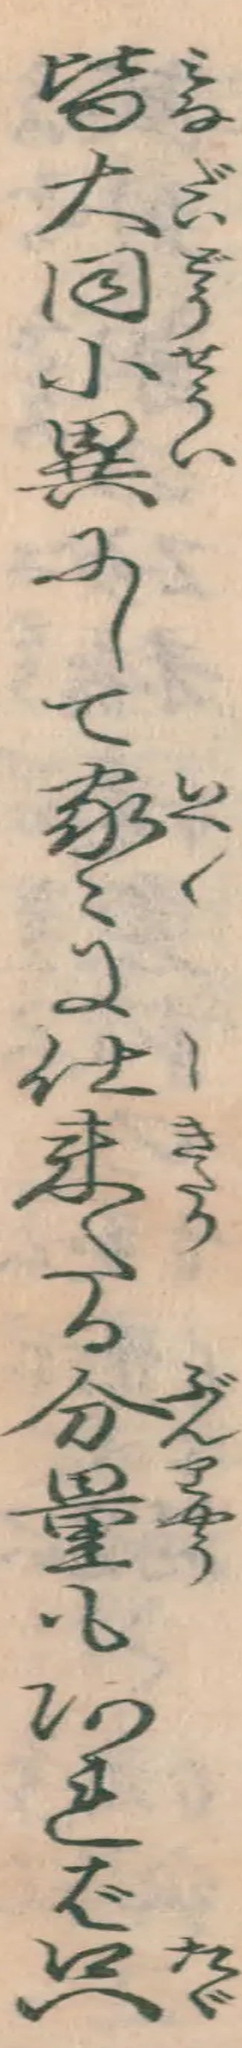皆大同小異にして家々に仕来たる分量もあれば只
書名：四季漬物鹽嘉言
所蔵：国立国会図書館 National Diet Library, JAPAN
